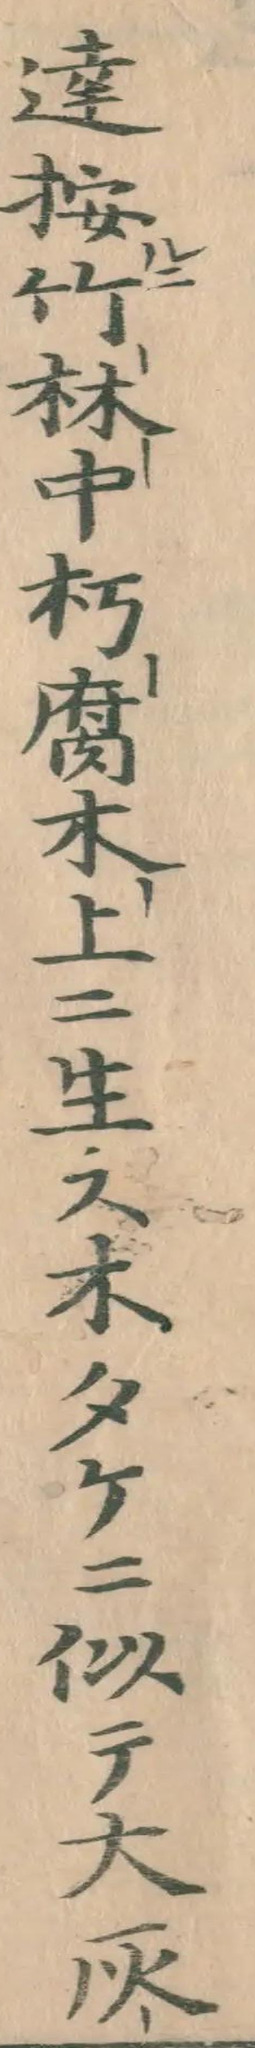達按林中朽腐木上ニ生ス木タケニ似テ大灰
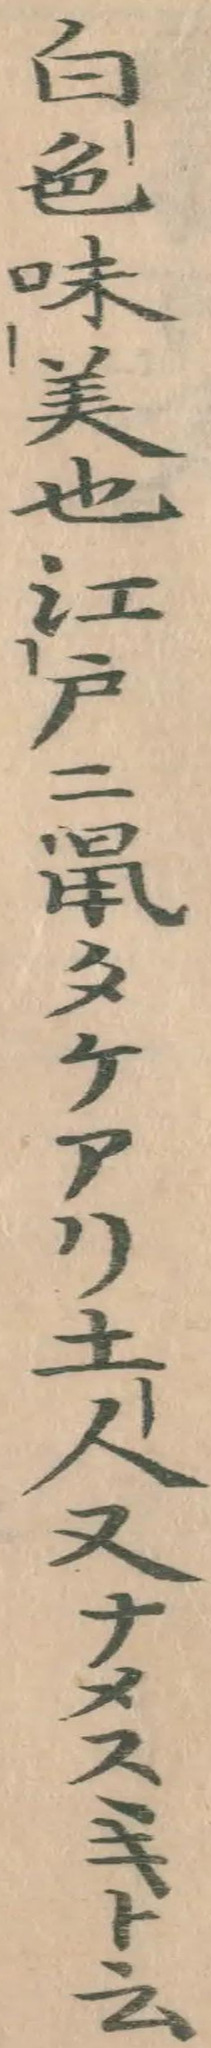白色味美也江戸ニ鼠タケアリ土人又ナメスヽキト云
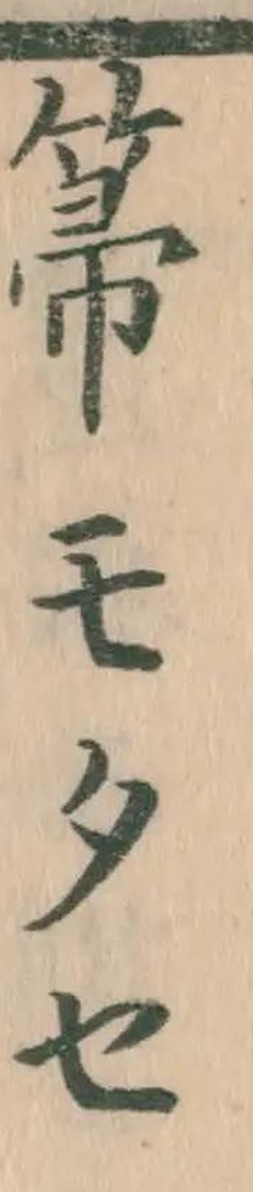箒モタセ
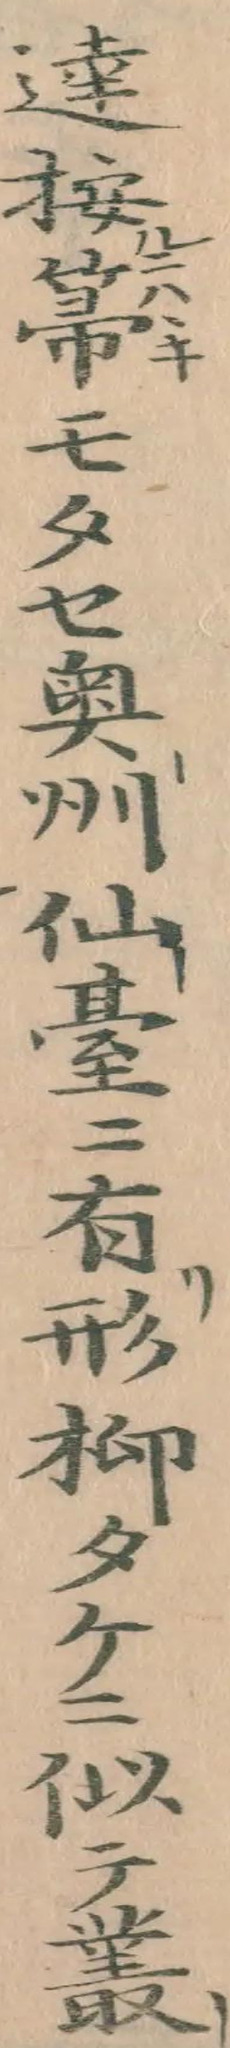達按箒モタセ奥州仙台ニ有形柳タケニ似テ叢
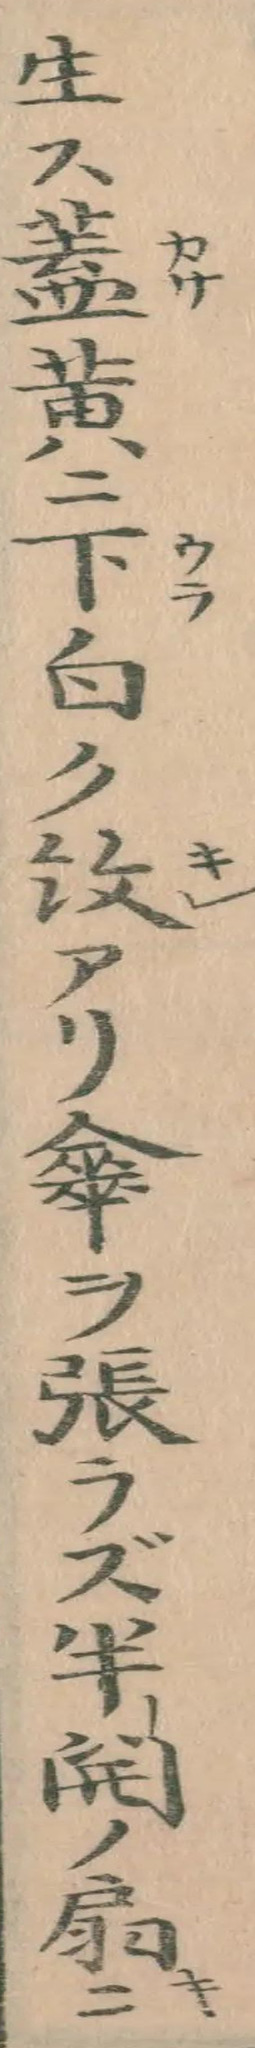生ス葢黄ニ下白ク紋アリ傘ヲ張ラズ半開ノ扇ニ
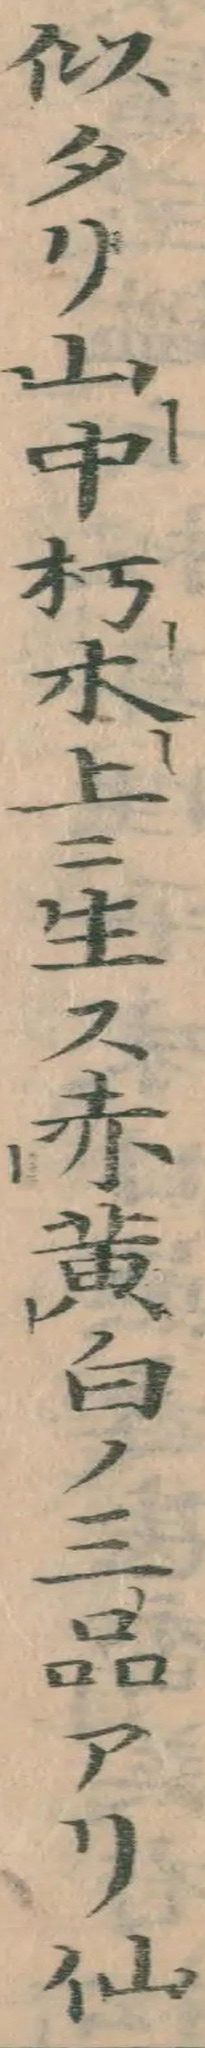似タリ山中朽木上ニ生ス赤黄白ノ三品アリ仙
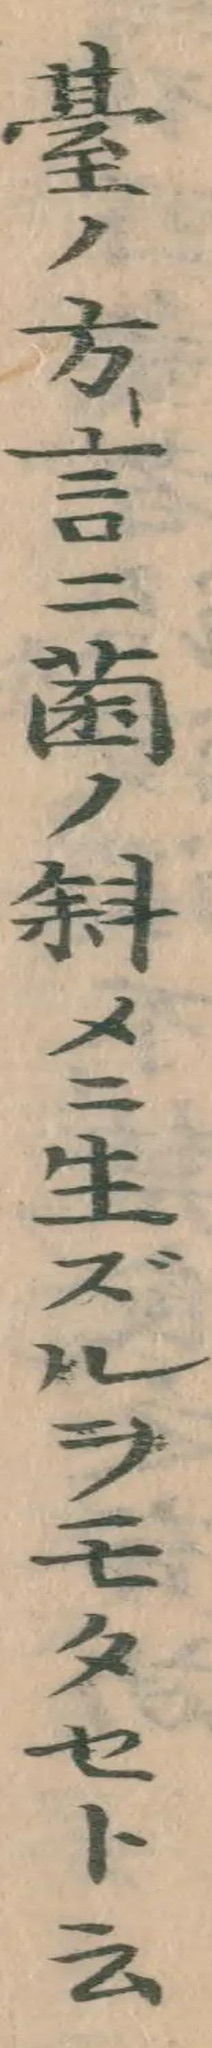台ノ方言ニ菌ノ斜メニ生ズルヲモタセト云
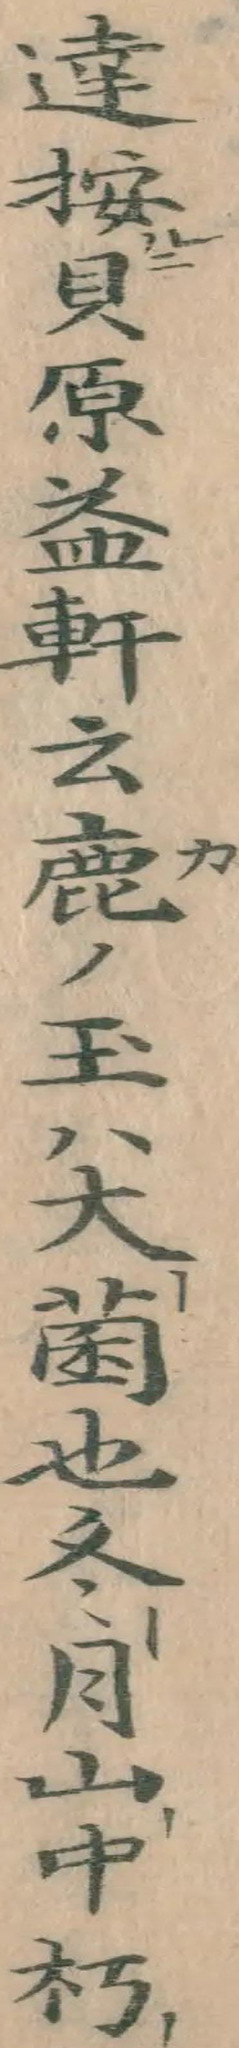達按貝原益軒云鹿ノ玉ハ大菌也冬月山中朽
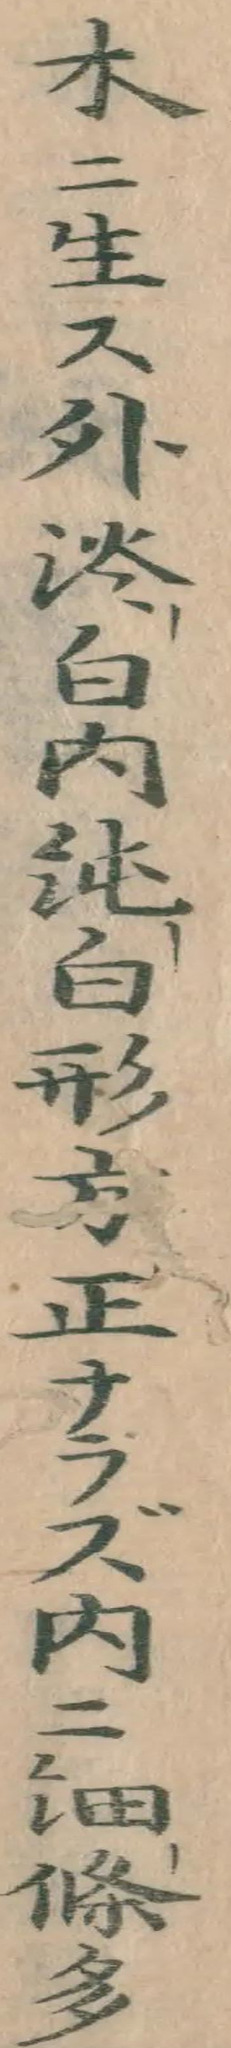木ニ生ス外淡白内純白形方正ナラズ内ニ細條多

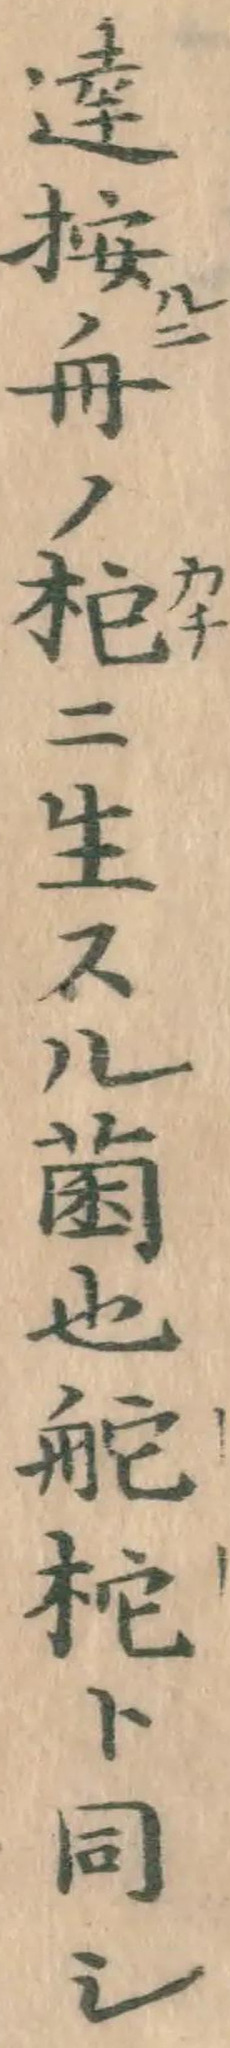達按舟ノ柁ニ生スル菌也舵柁ト同シ
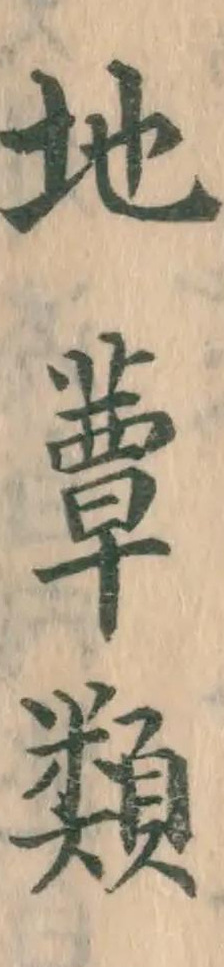地蕈類
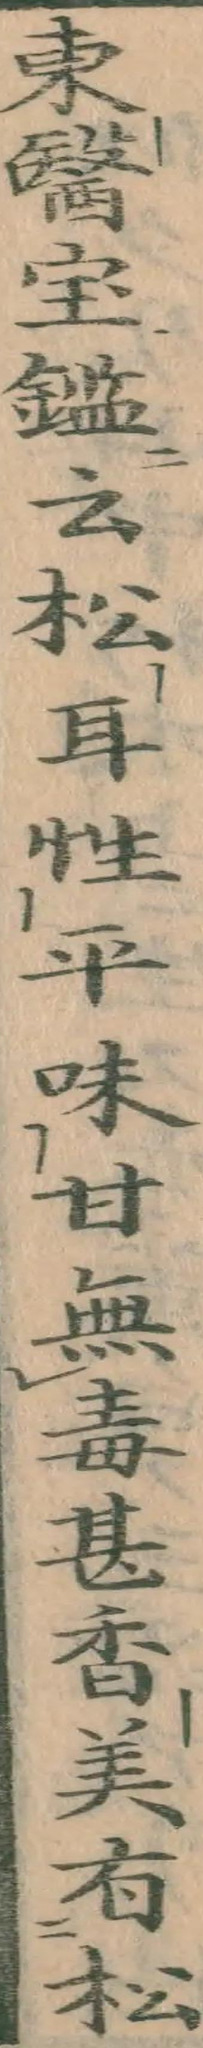東醫宝鑑云松耳性平味甘無毒甚香美有松
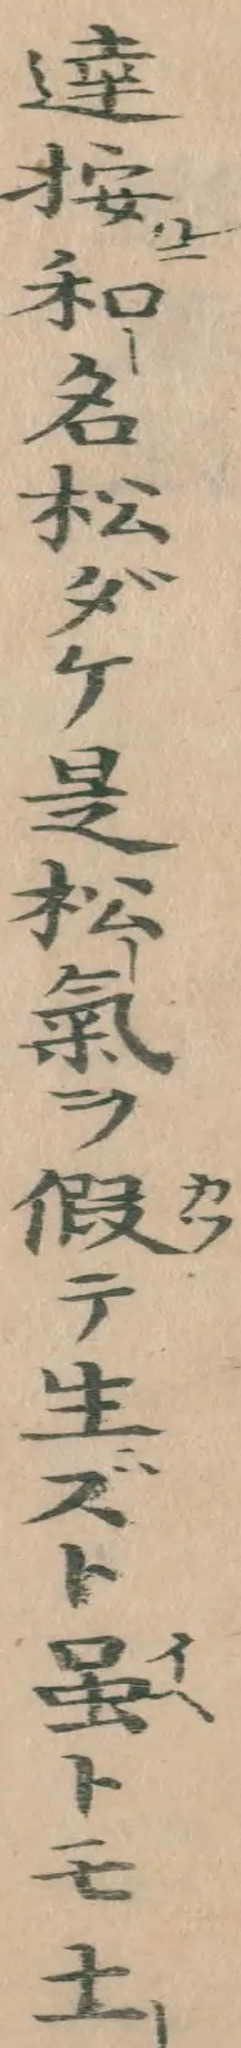達按和名松ダケ是松気ヲ假テ生ズト虽トモ土
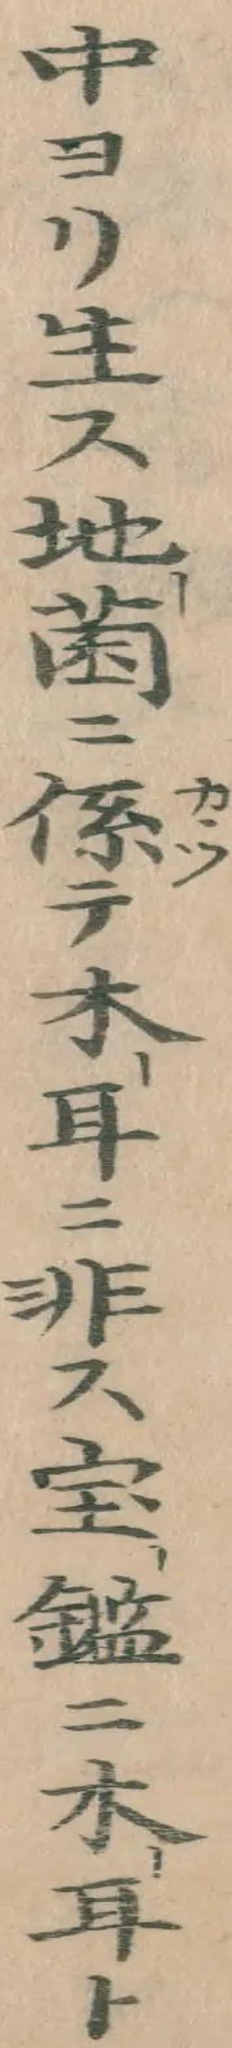中ヨリ生ス地菌ニ係テ木耳ニ非ス宝鑑ニ木耳ト
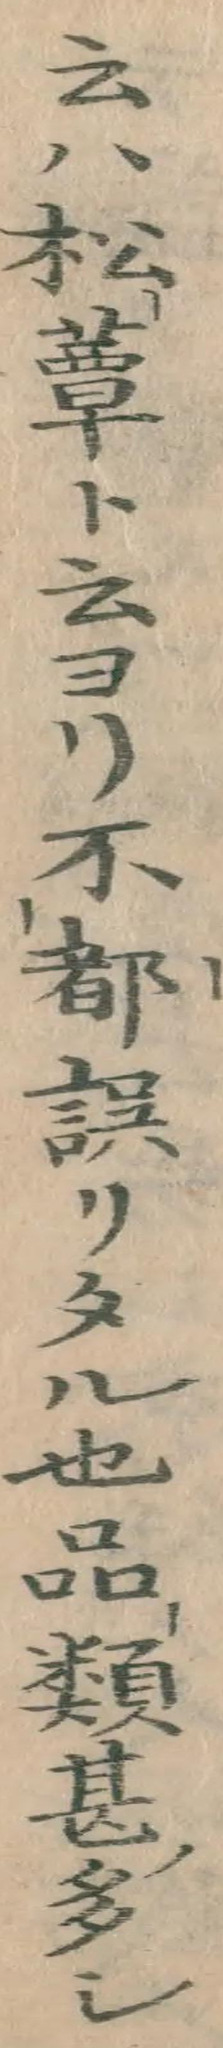云ハ松蕈ト云ヨリ不都誤リタル也品類甚多シ
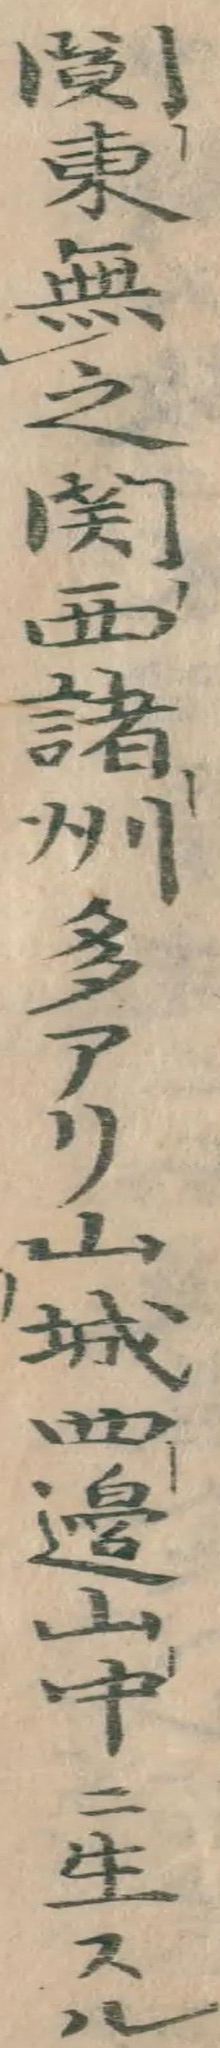関東無之関西諸州多アリ山城四辺山中ニ生スル
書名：怡顔斎菌品 2巻
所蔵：国立国会図書館 National Diet Library, JAPAN
